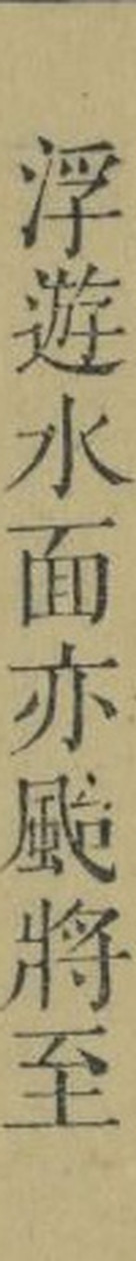浮遊水面亦颱將至
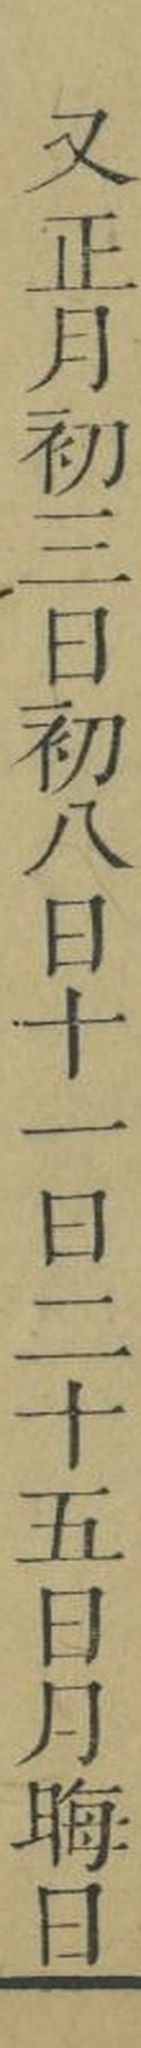又正月初三日初八日十一日二十五日月晦日
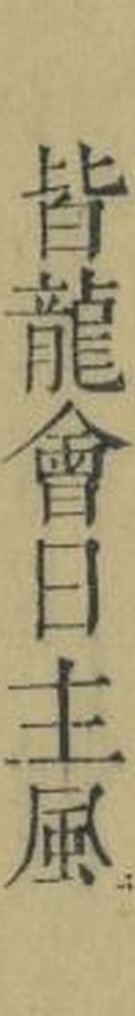皆龍會日主風
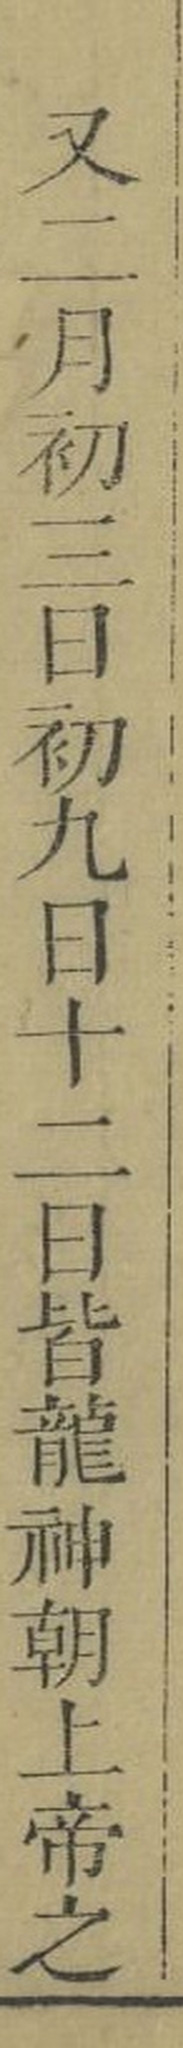又二月初三日初九日十二日皆龍神朝上帝之

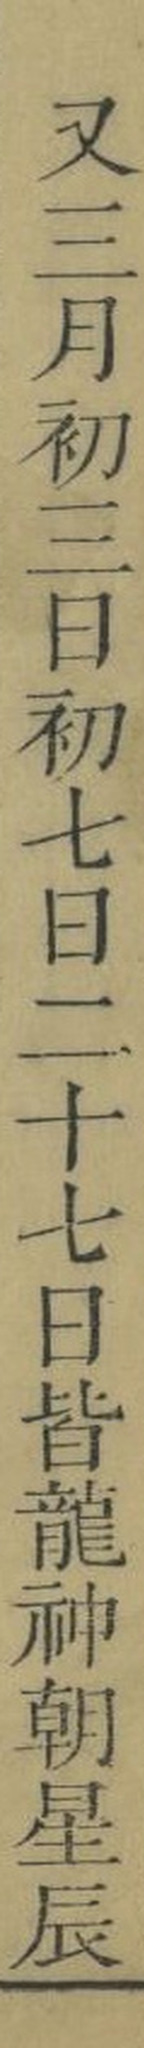又三月初三日初七日二十七日皆龍神朝星辰
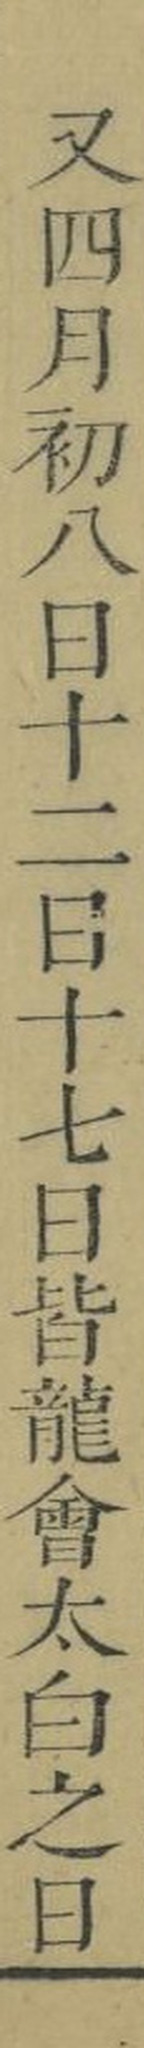又四月初八日十二日十七日皆龍會太白之日
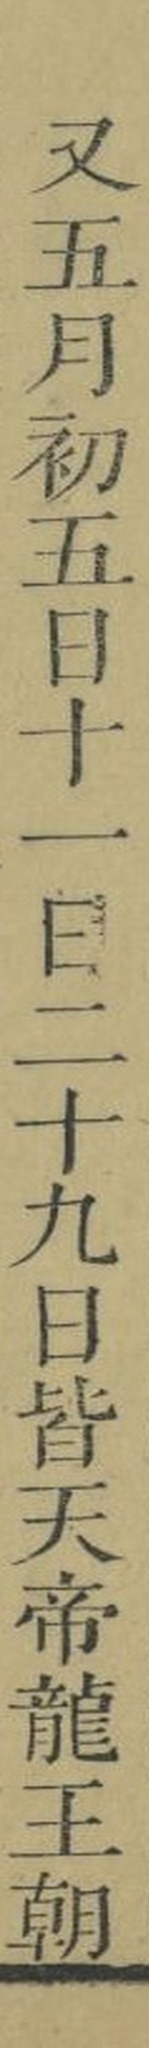又五月初五日十一日二十九日皆天帝龍王朝
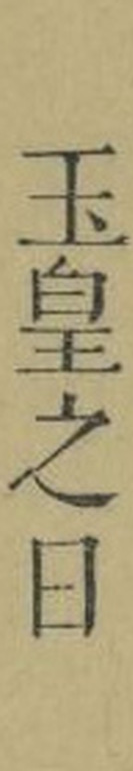玉皇之日
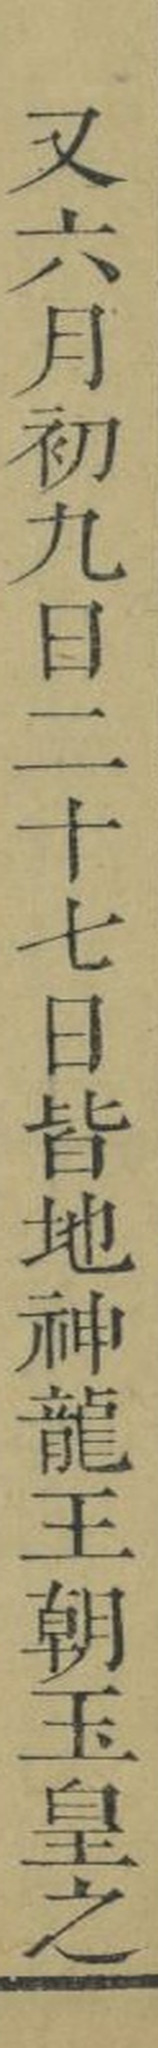又六月初九日二十七日皆地神龍王朝玉皇之
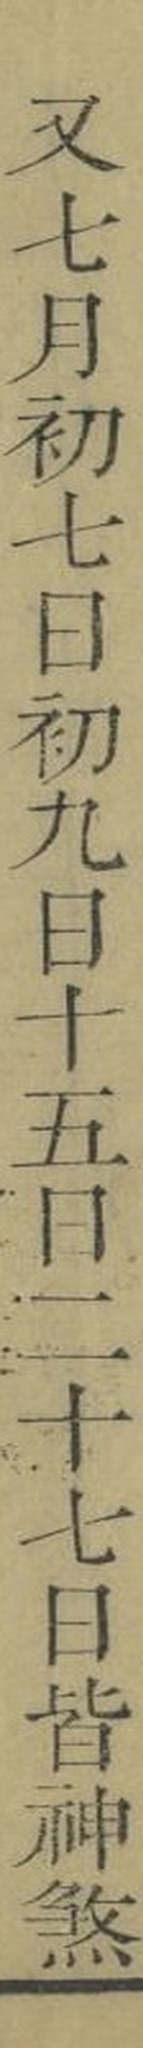又七月初七日初九日十五日二十七日皆神煞
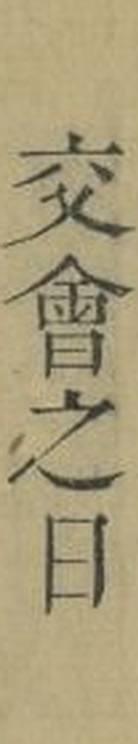交會之日
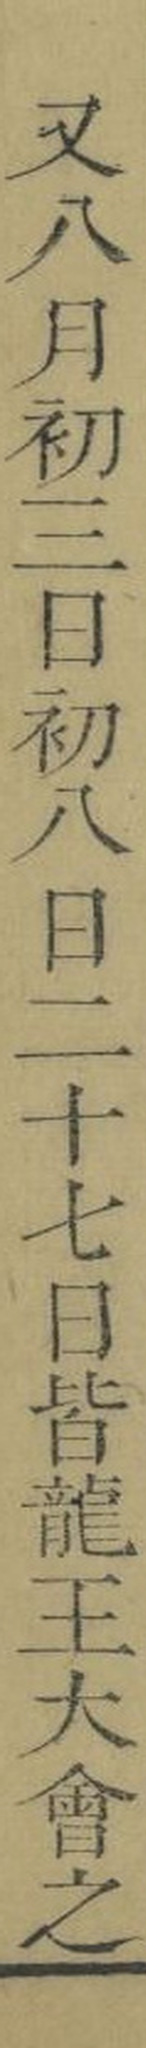又八月初三日初八日二十七日皆龍王大會之

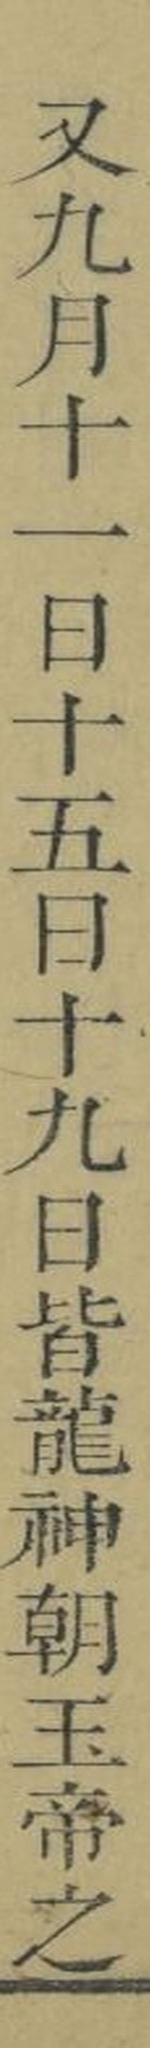又九月十一日十五日十九日皆龍神朝玉帝之
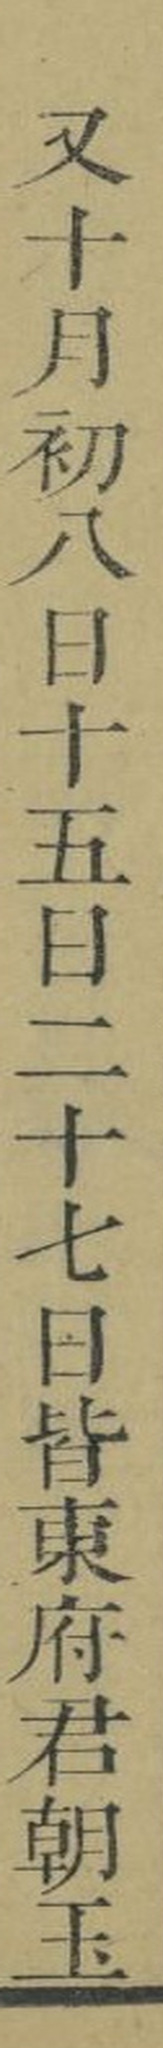又十月初八日十五日二十七日皆東府君朝玉
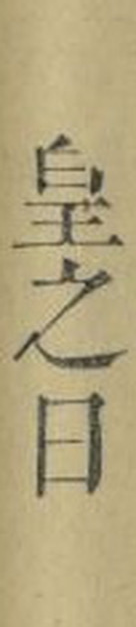皇之日
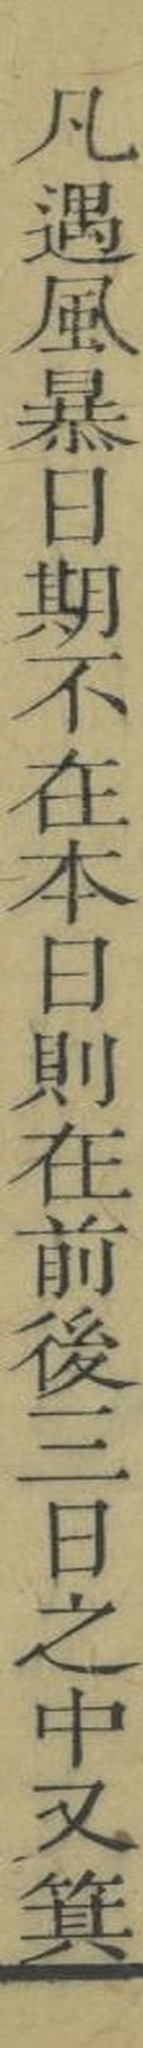凡遇風暴日期不在本日則在前後三日之中又箕
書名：中山伝信録 巻一
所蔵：University of the Ryukyus Library
